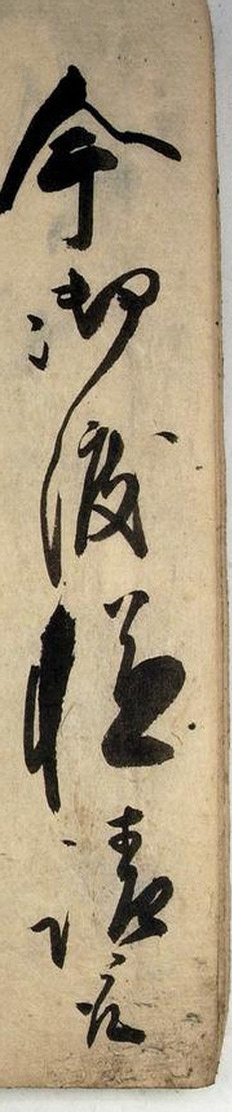今御渡慥請取
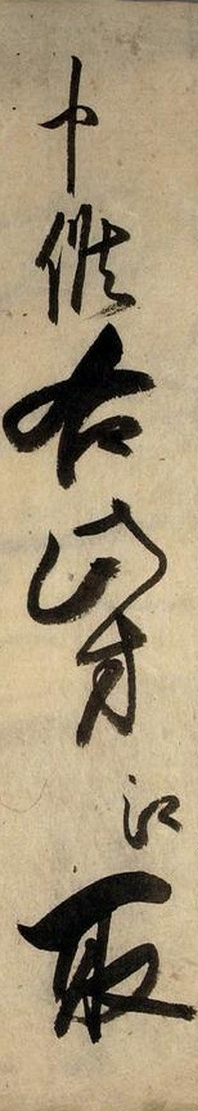申候右此方え取
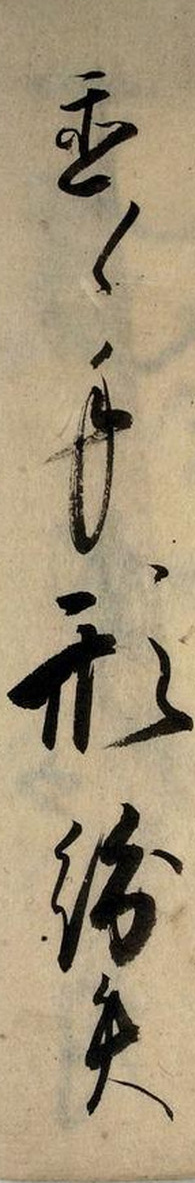置候手形紛失
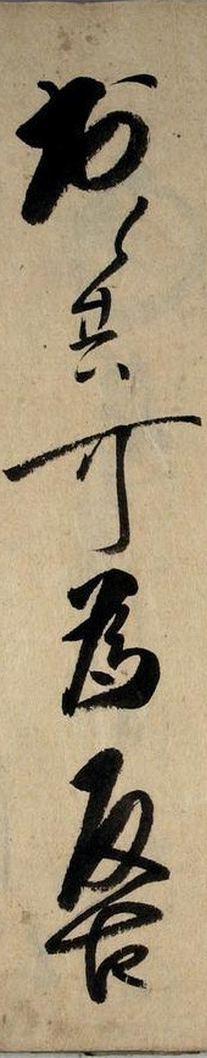出候共可為反古

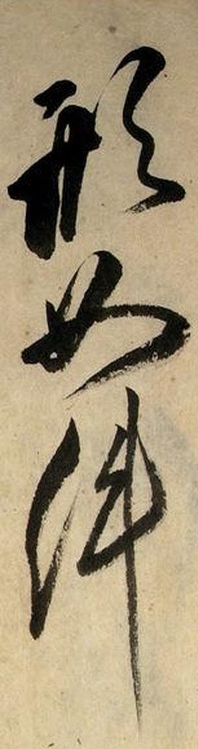形如件
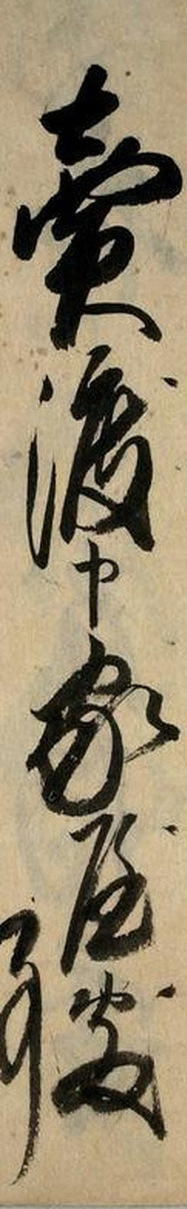売渡申家屋敷事
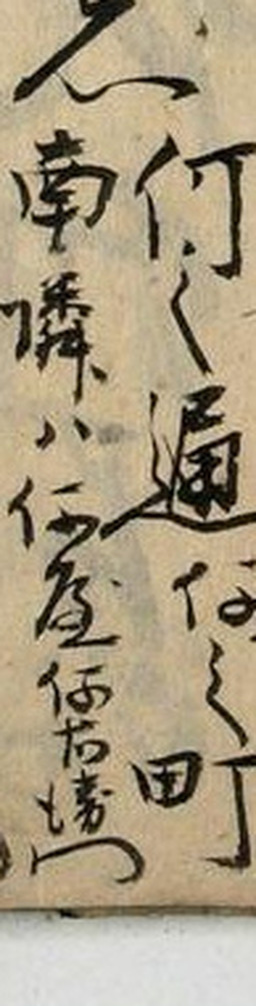北隣は何屋何右衛門
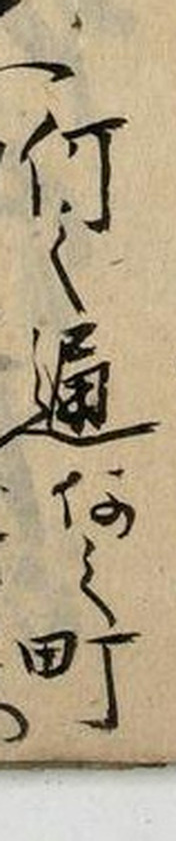何之通何之町
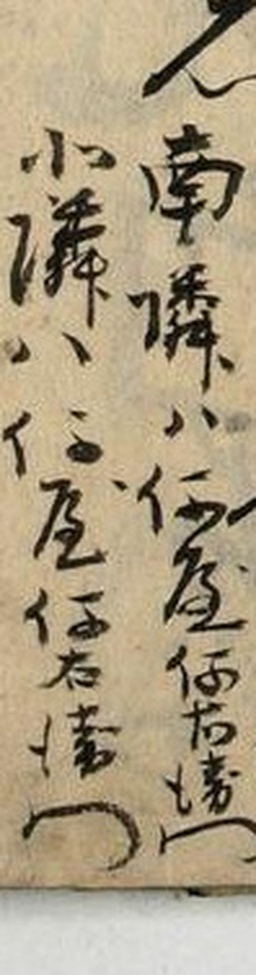北隣は何屋何右衛門
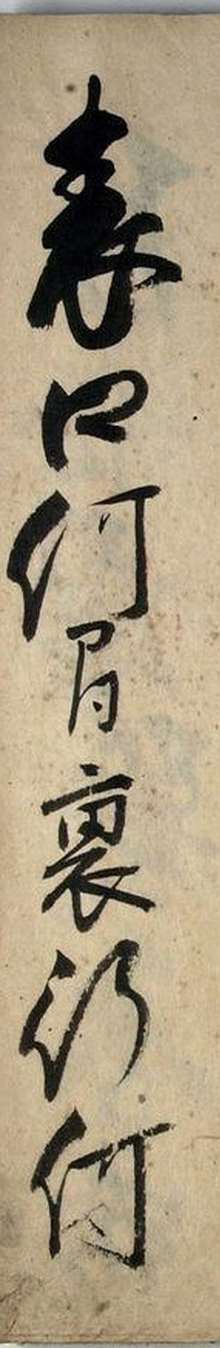表口何間裏行何

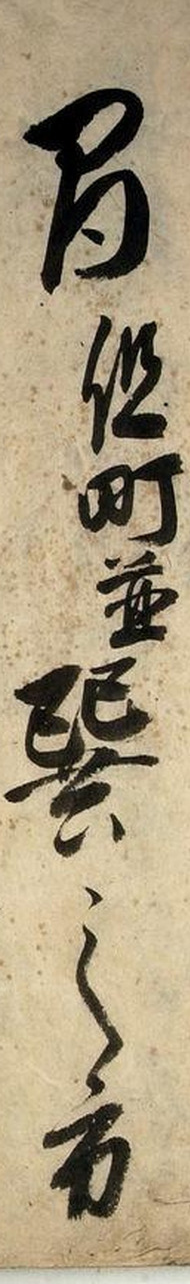間但町並巽之方
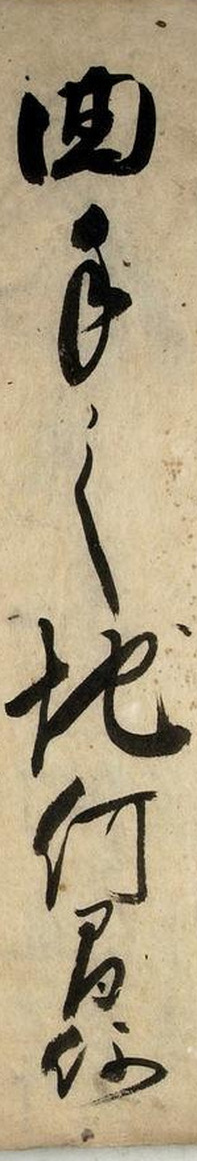曲手之地何間何
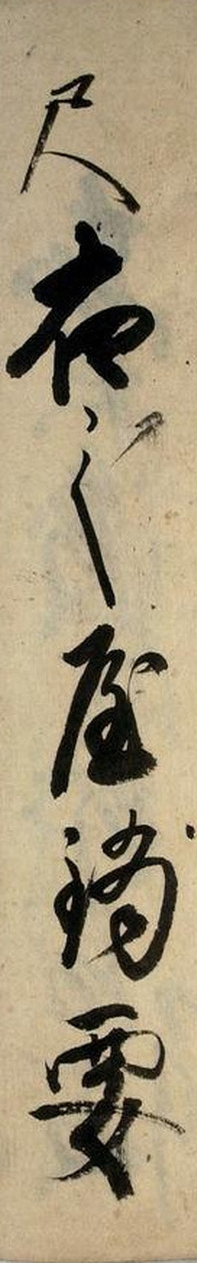尺右之屋鋪要
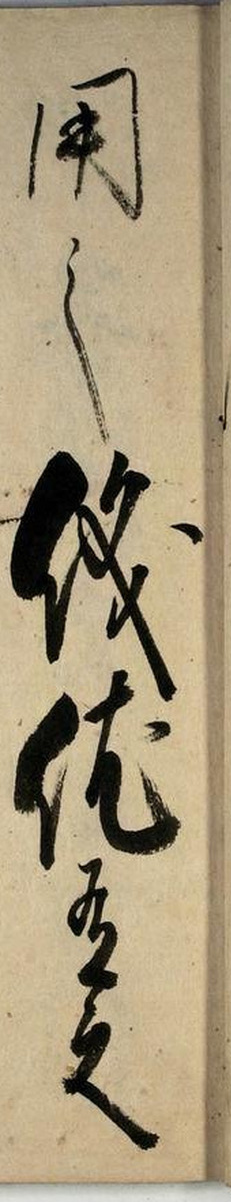用之儀依有之
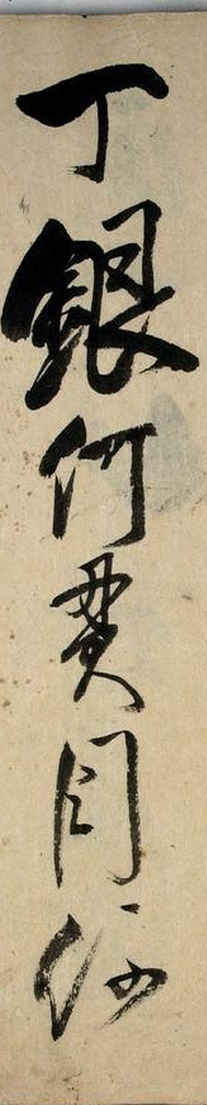丁銀何貫目何
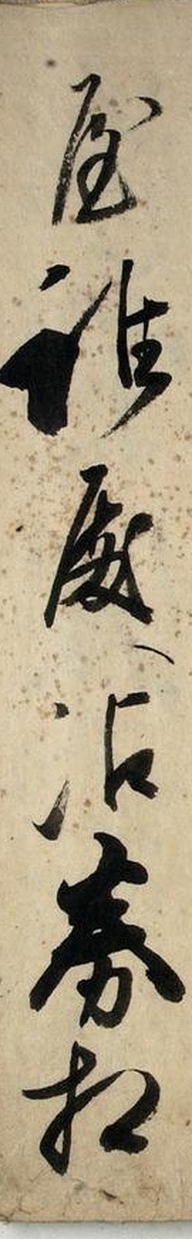屋誰殿沽券相
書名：御手本（手習、預リ申銀子之事、売渡申家屋敷事ほか）
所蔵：福井県文書館 Fukui Prefectural Archives
